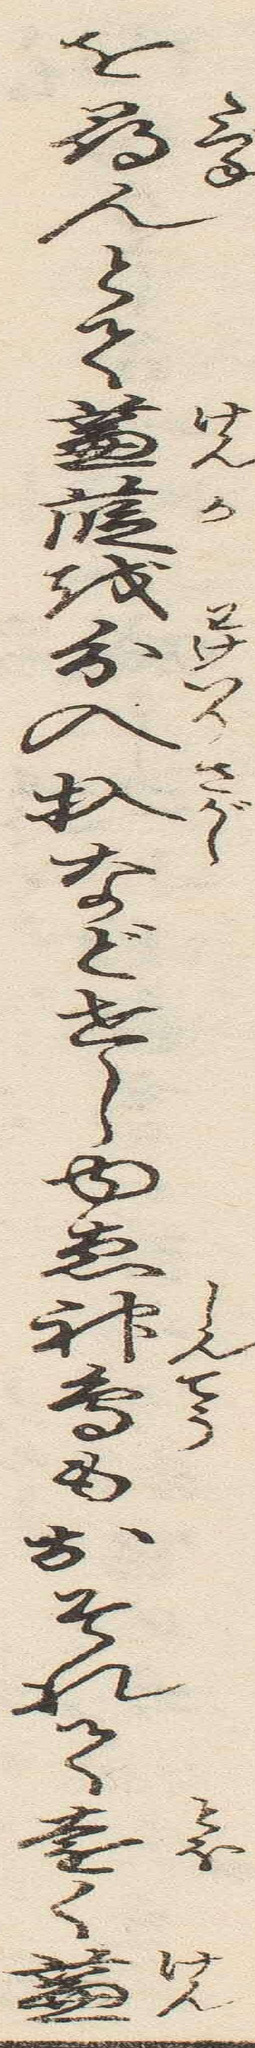を尋んとて蒹葭を分入扖などせしゆゑ神鳥もおそれて遠く蒹
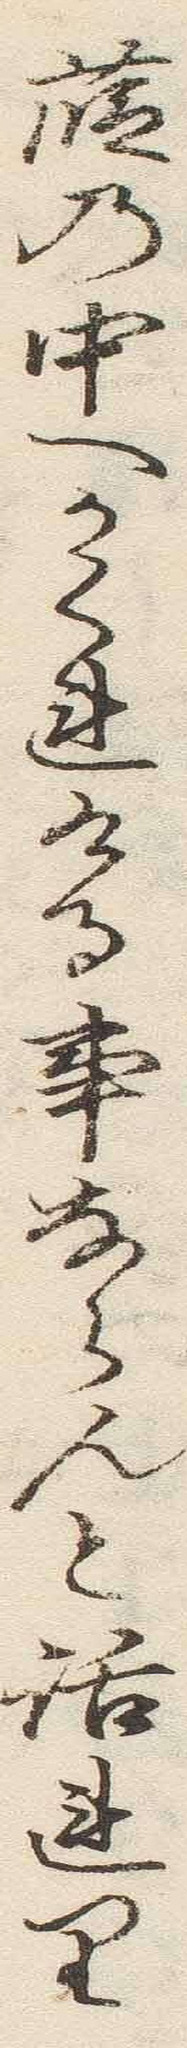葭の中へかくれける事ならんと話れり
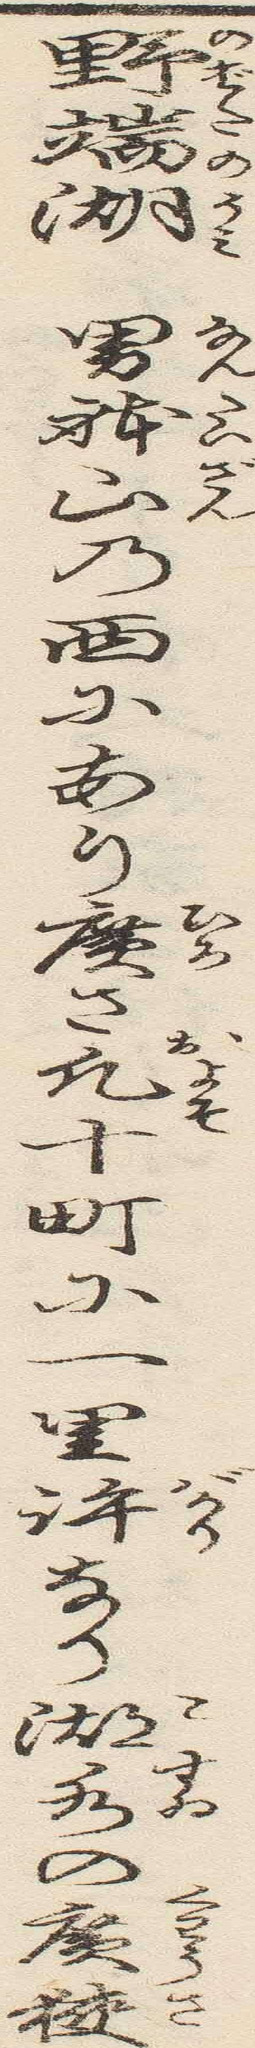野端湖男躰山の西にあり廣さ凢十町に一里許なり湖水の廣狹
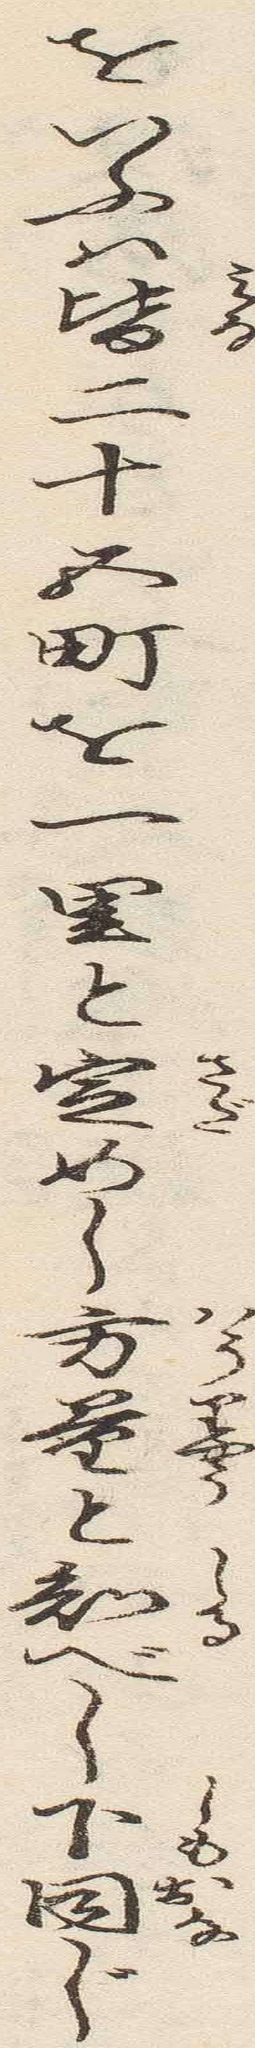をいふは皆二十五町を一里と定めし方量と知べし下同じ
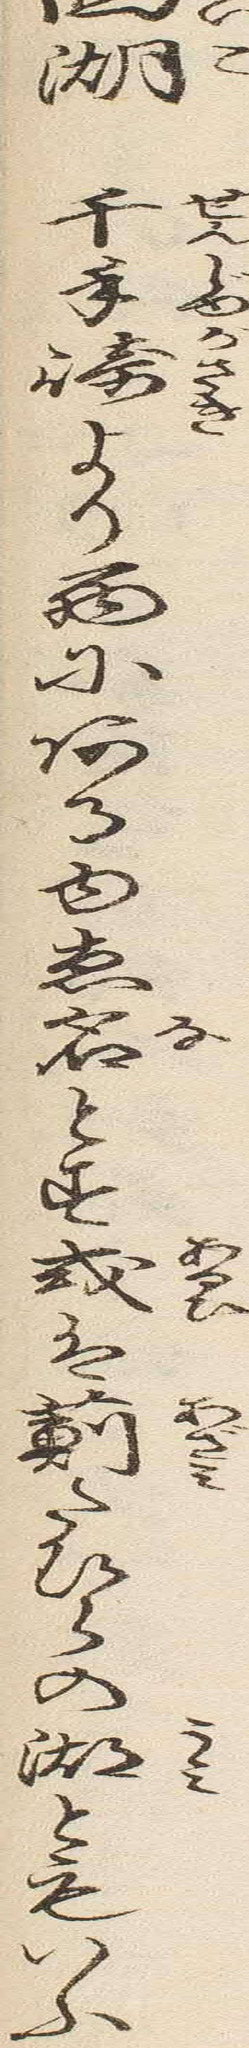西湖千手﨑より西にあるゆゑ名とす或は薊たひらの湖ともいふ
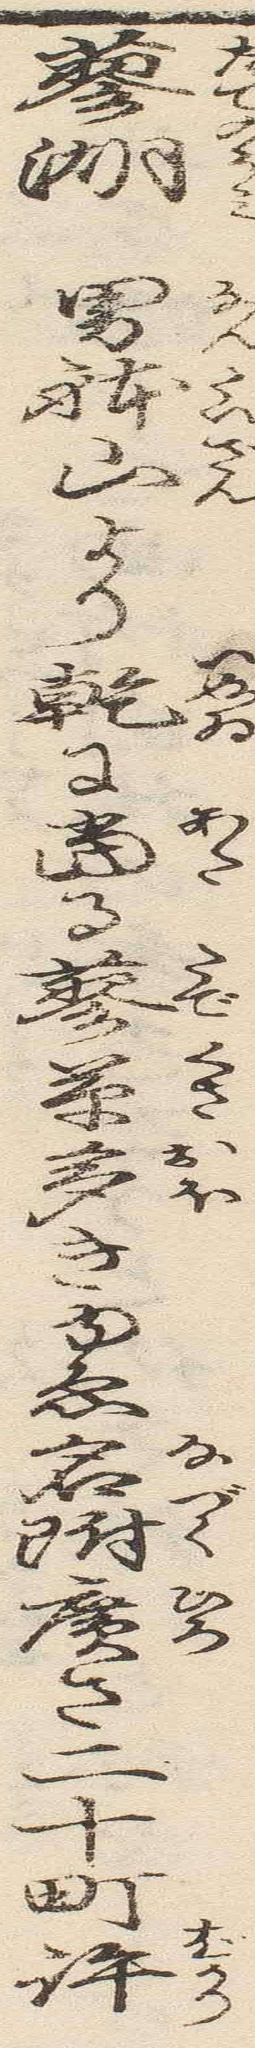蓼湖男躰山より乾に當る蓼草多きゆゑ名附廣さ二十町許
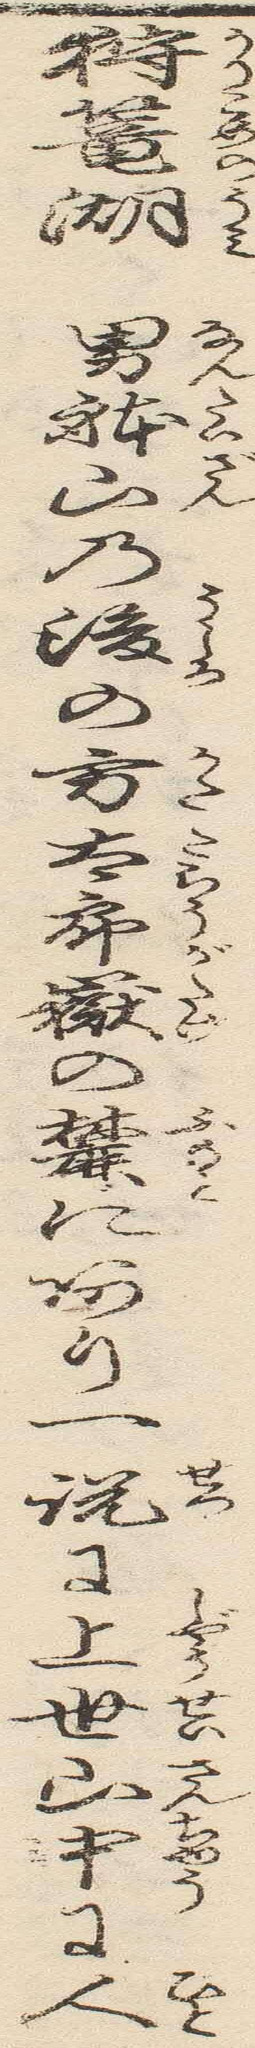狩篭湖男躰山の後の方太郎嶽の麓にあり一説に上世山中に人
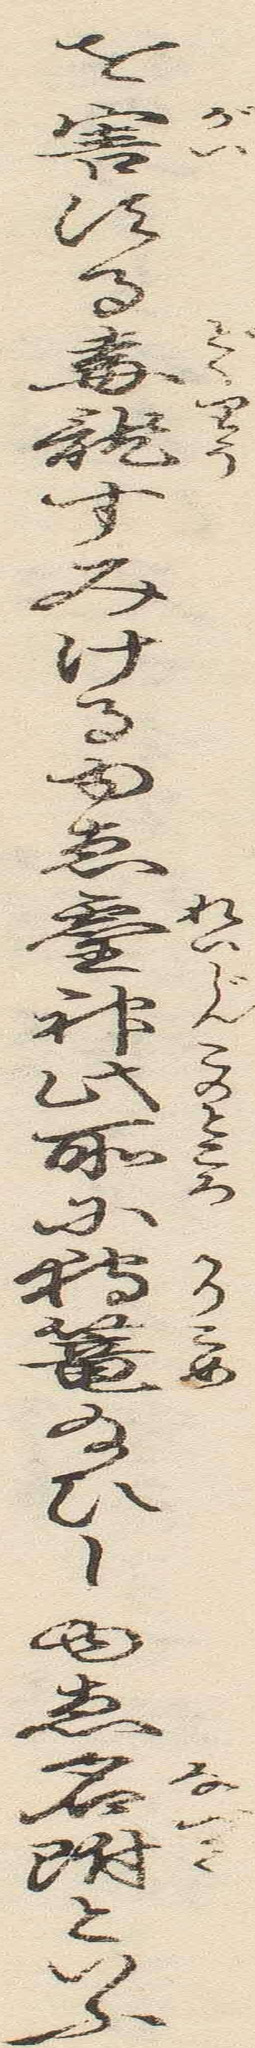を害する毒龍すみけるゆゑ靈神此所に狩篭給ひしゆゑ名附といふ
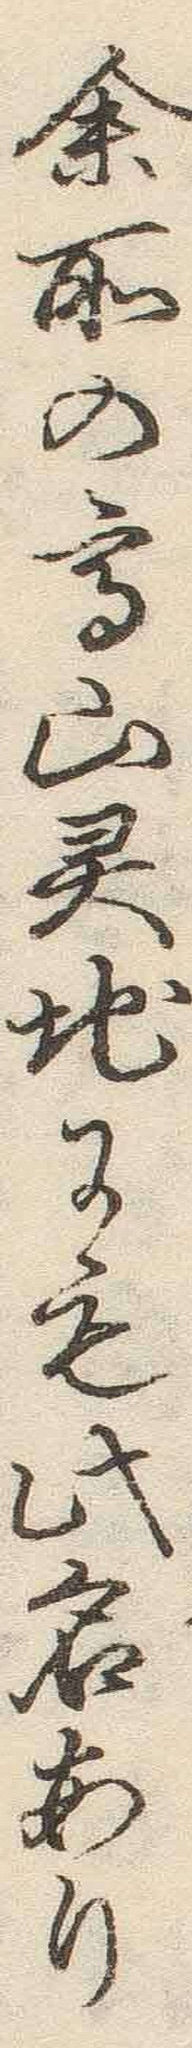余所の高山㚑地にも此名あり
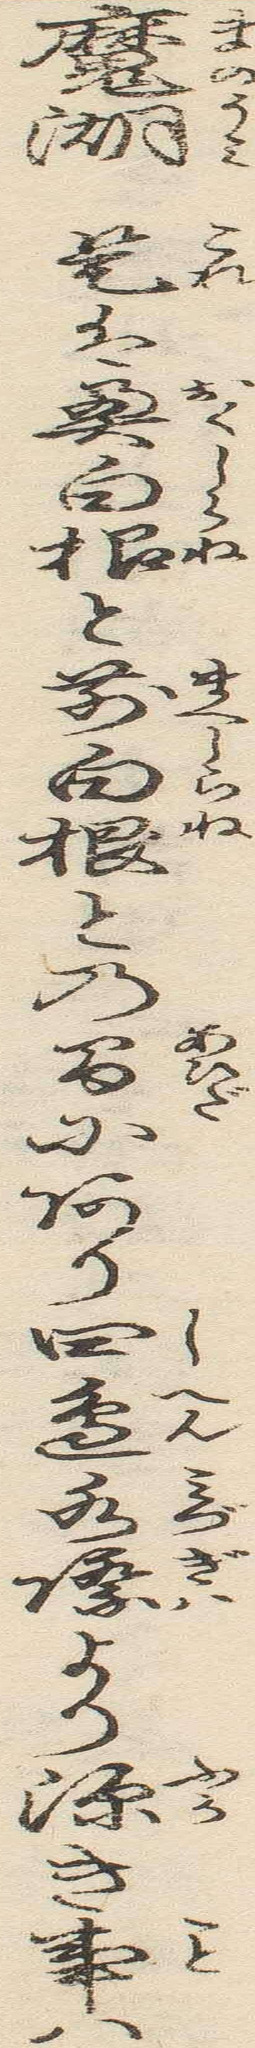魔湖是は奥白根と前白根との間にあり四邊水際より深き事は
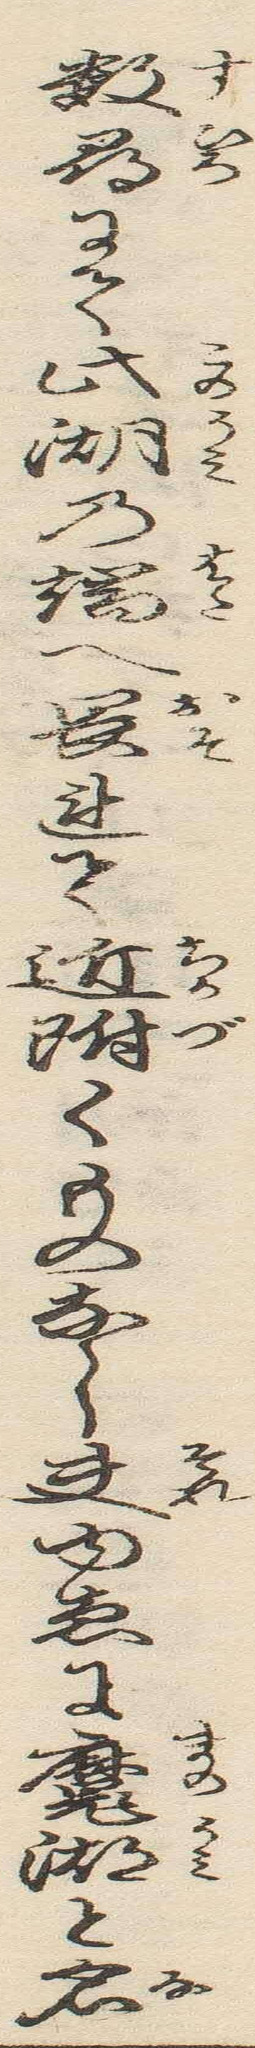数尋にて此湖の端へ畏れて近附くものなし夫ゆゑ魔湖と名
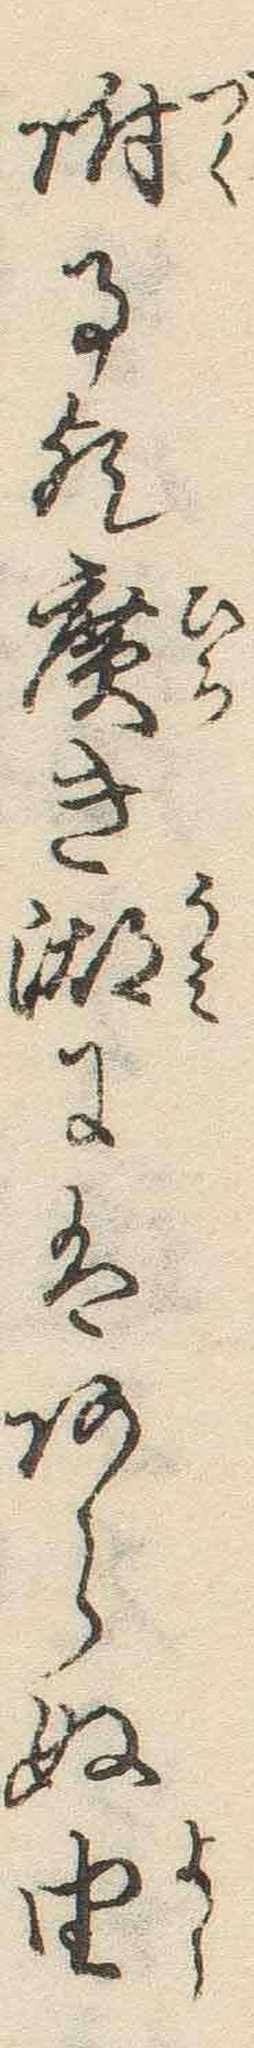附る欤廣き湖にはあらぬ由
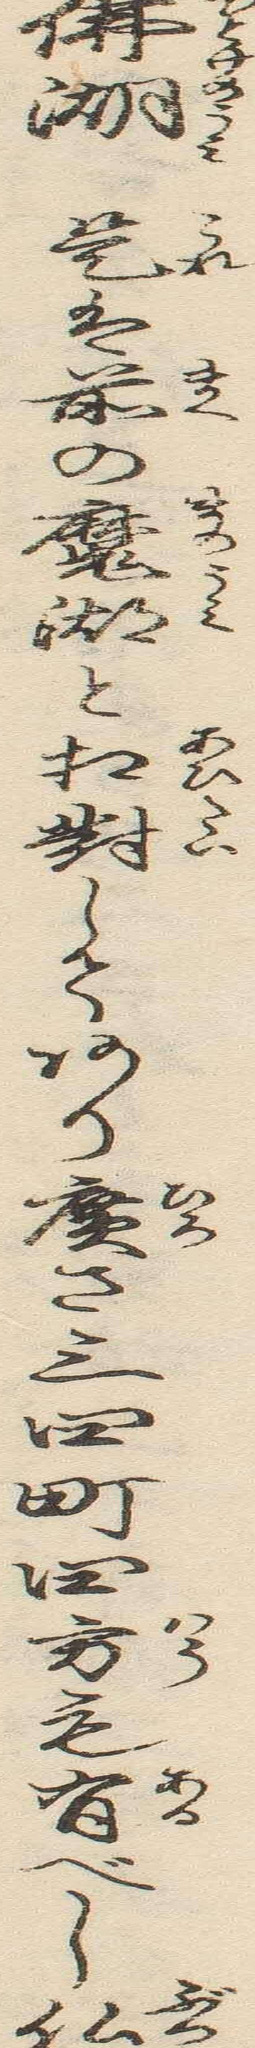佛湖是は前の魔湖と相對してあり廣さ三四町四方も有るべし仏
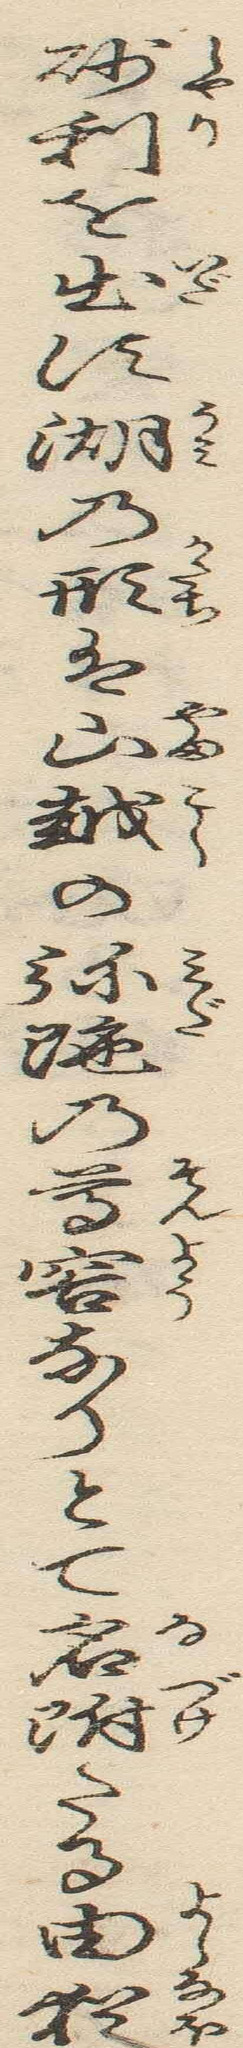砂利を出す湖の形は山越の弥陀の尊容なりとて名附たる由猶
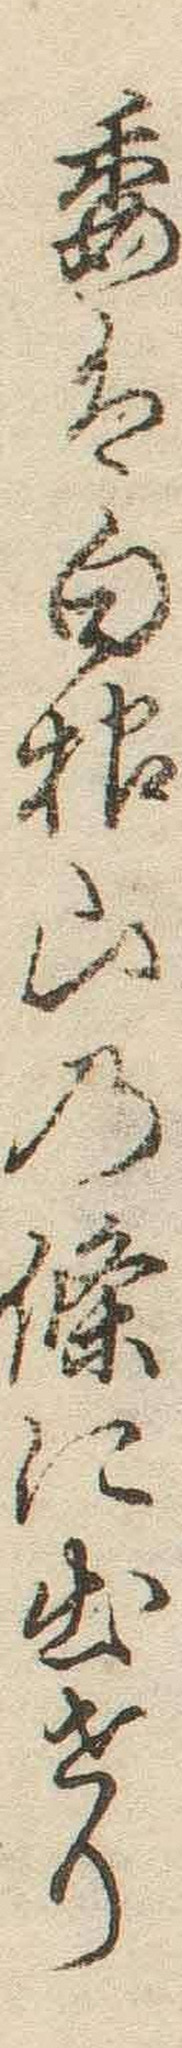委は白根山の條に出せり
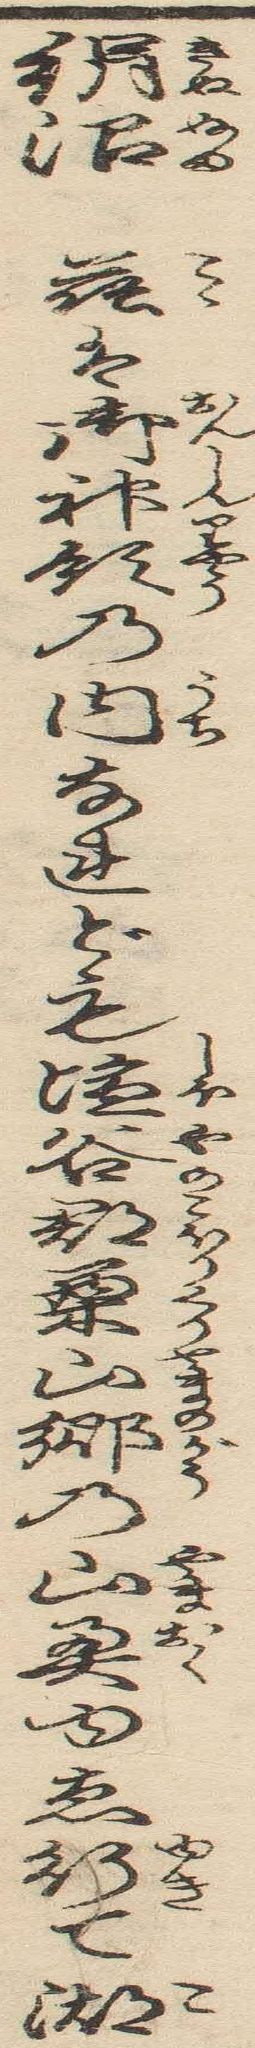絹沼兹は御神領の内なれども塩谷郡栗山郷の山奥ゆゑ行て湖
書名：日光山志
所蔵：東京学芸大学附属図書館 国文学研究資料館
